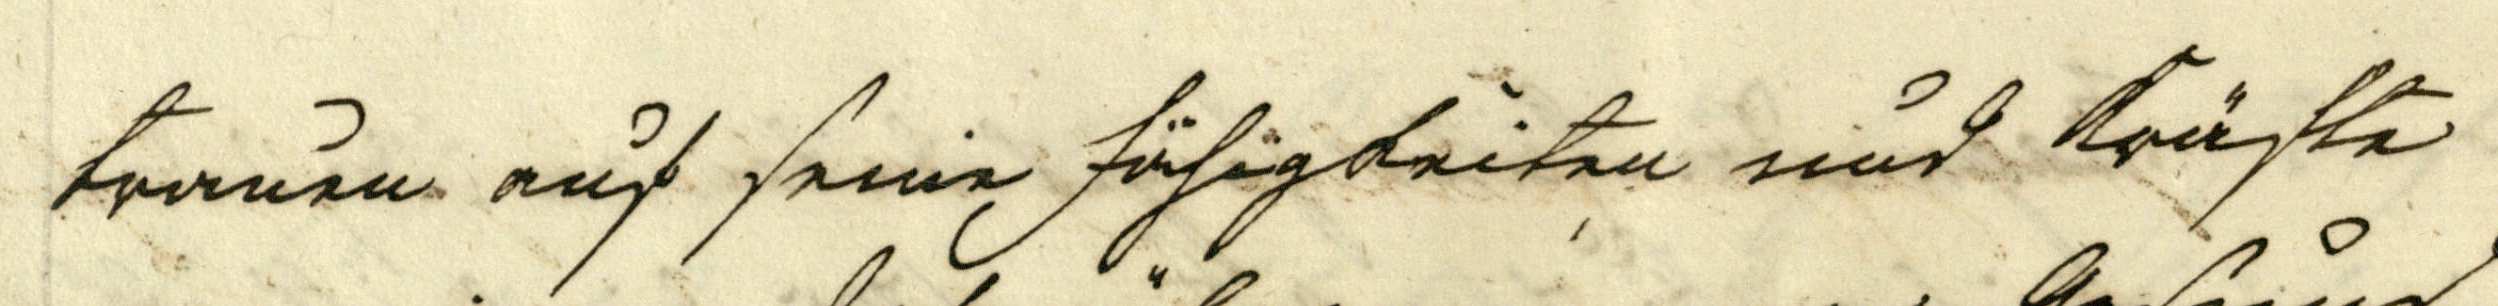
trauen auf seine Fähigkeiten und Kräfte
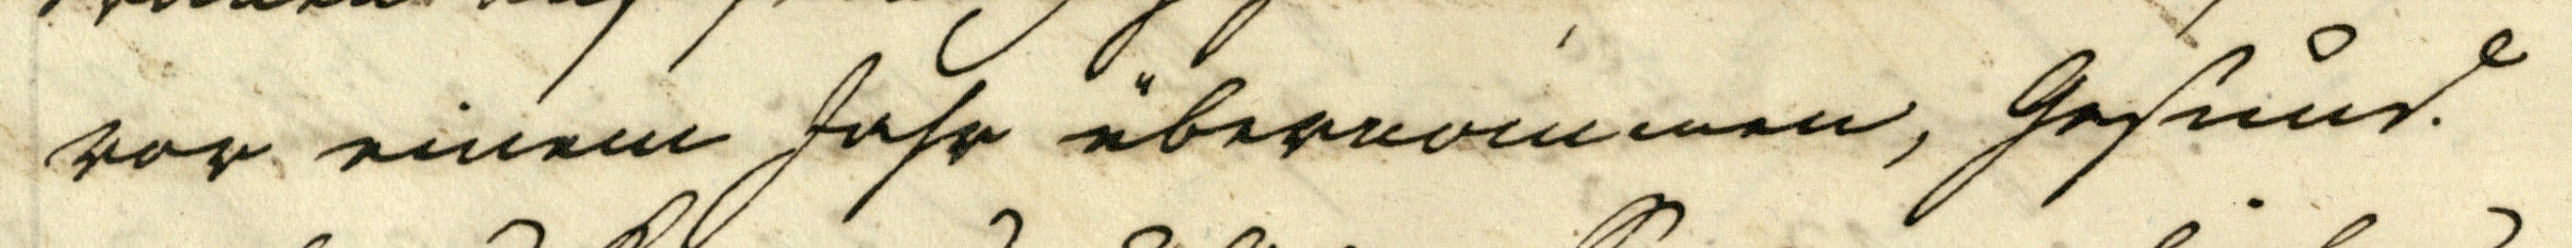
vor einem Jahr übernommen, Gesund¬
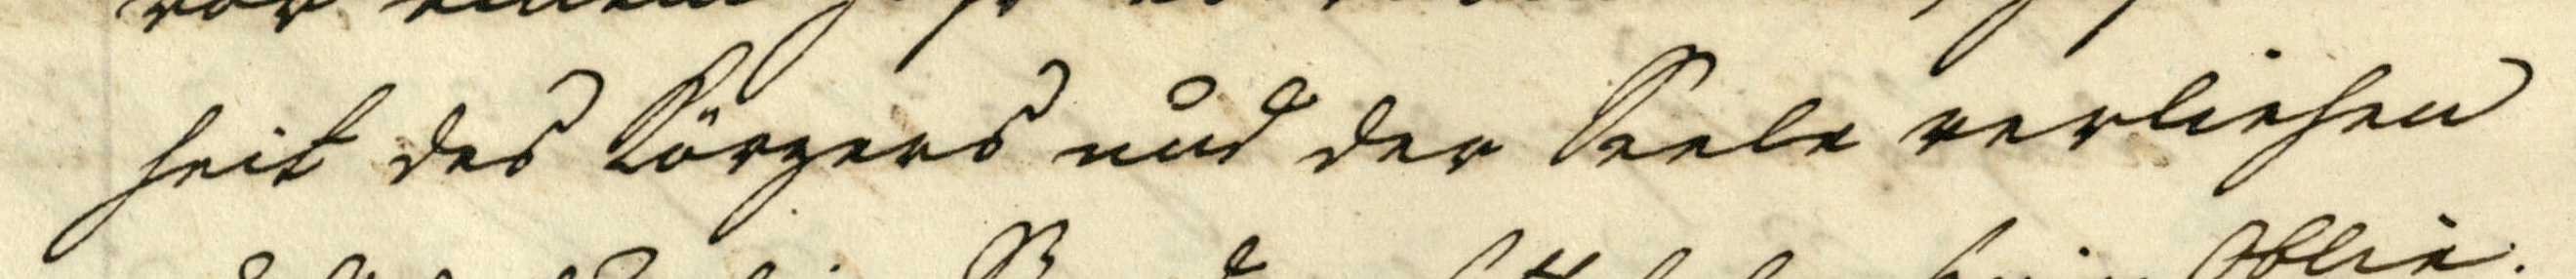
heit des Körpers und der Seele verliehen
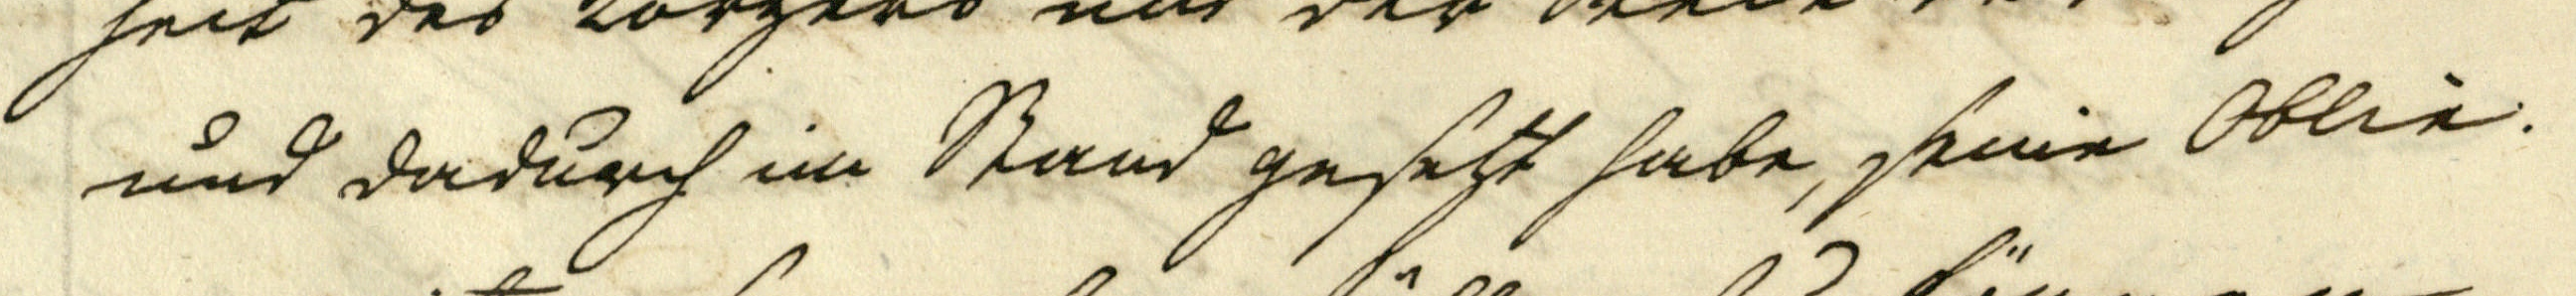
und dadurch im Stand gesetzt habe, seine Oblie¬
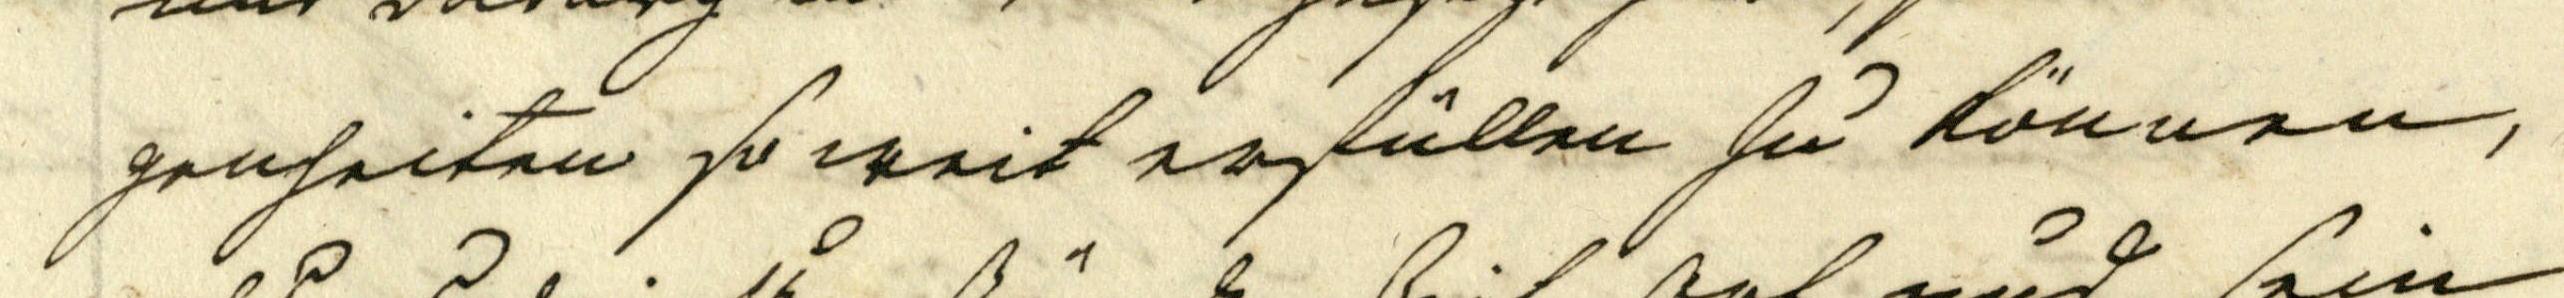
genheiten so weit erfüllen zu können,
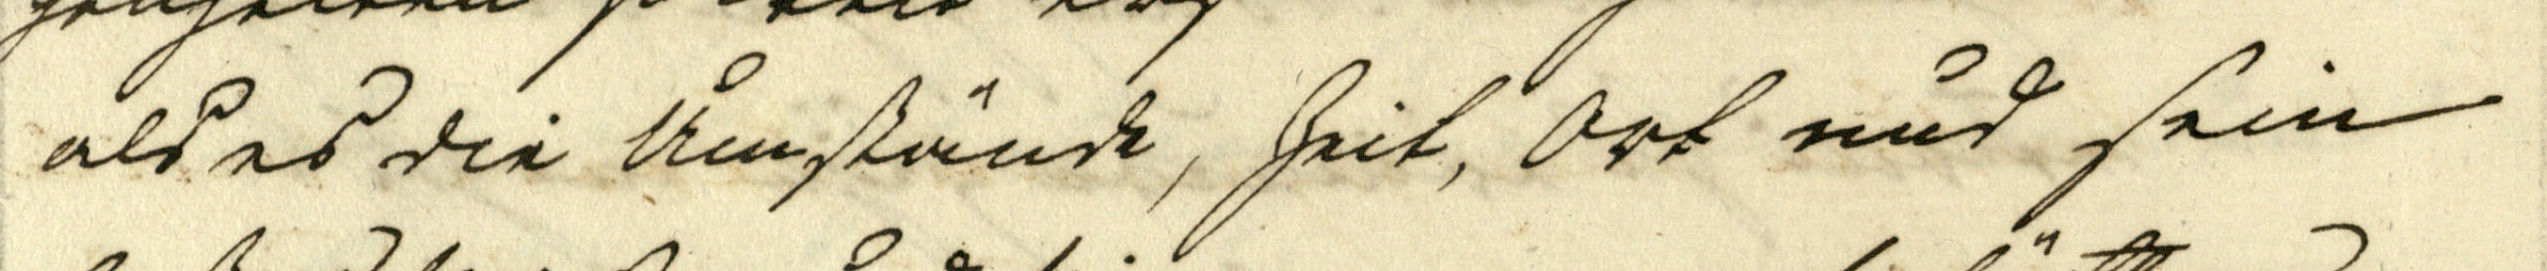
als es die Umstände, Zeit, Ort und sein
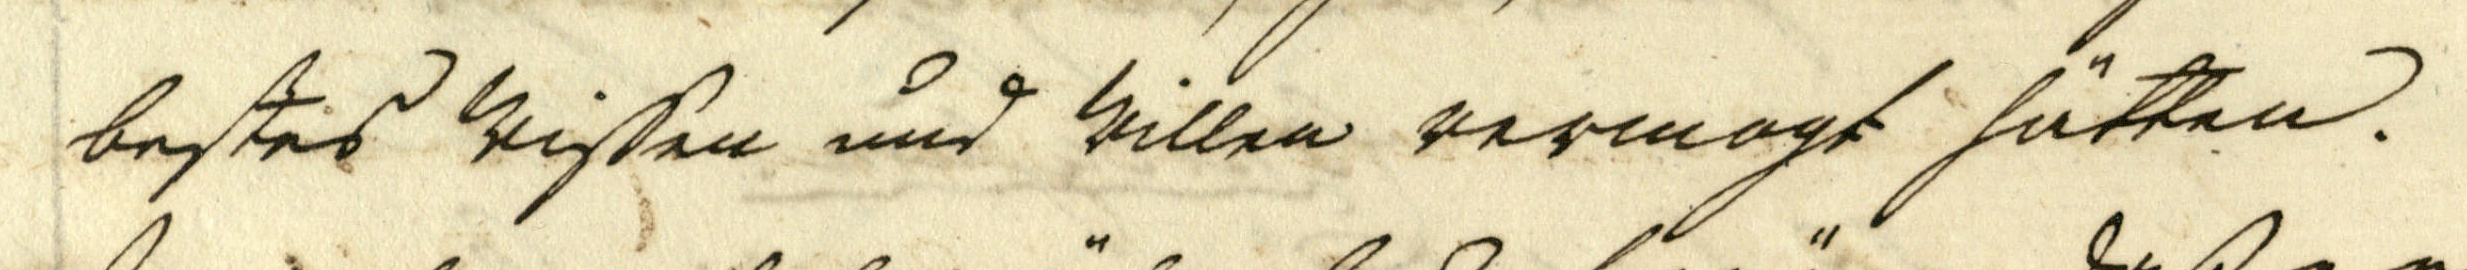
bestes Wissen und Willen vermogt hätten.
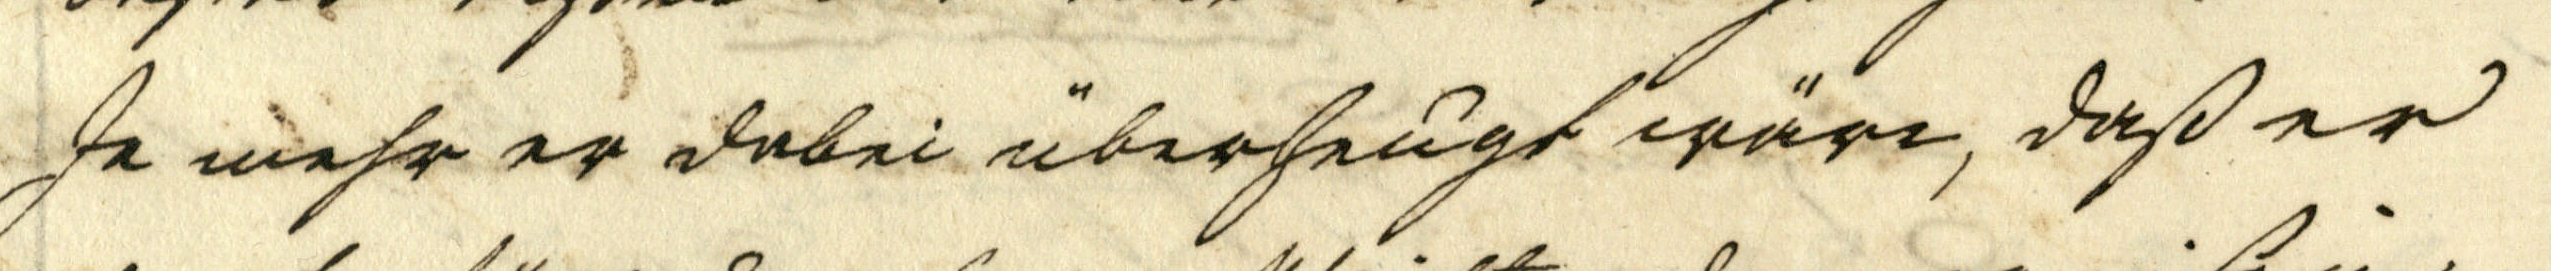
Je mehr er dabei überzeugt wäre, daß er
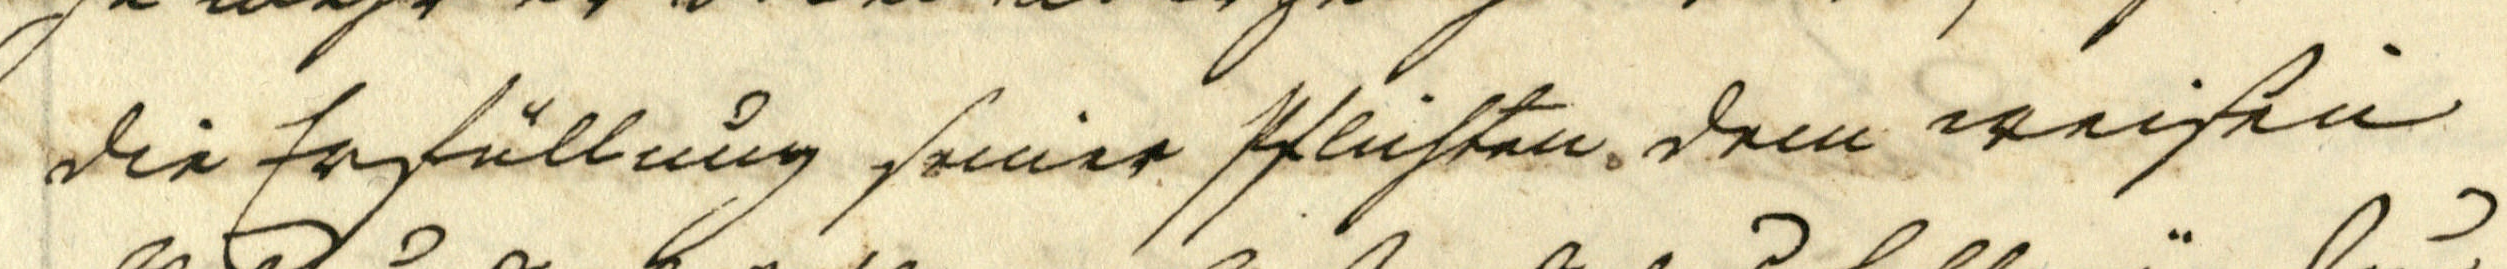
die Erfüllung seiner Pflichten dem weisen
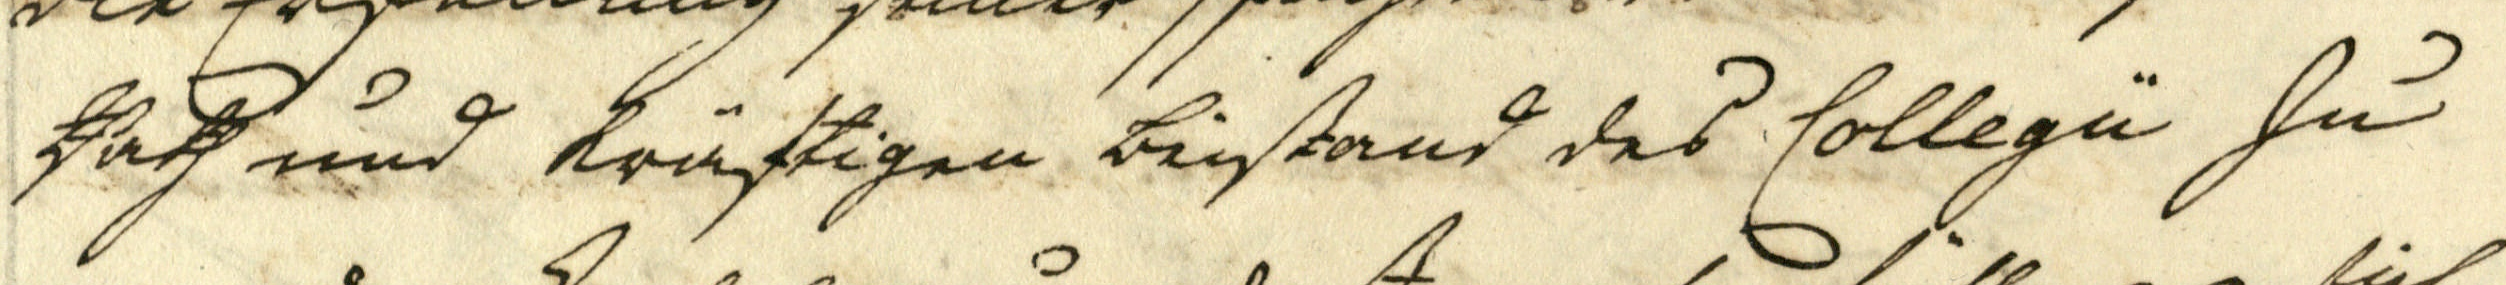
Rath und kräftigen Beistand des Collegii zu
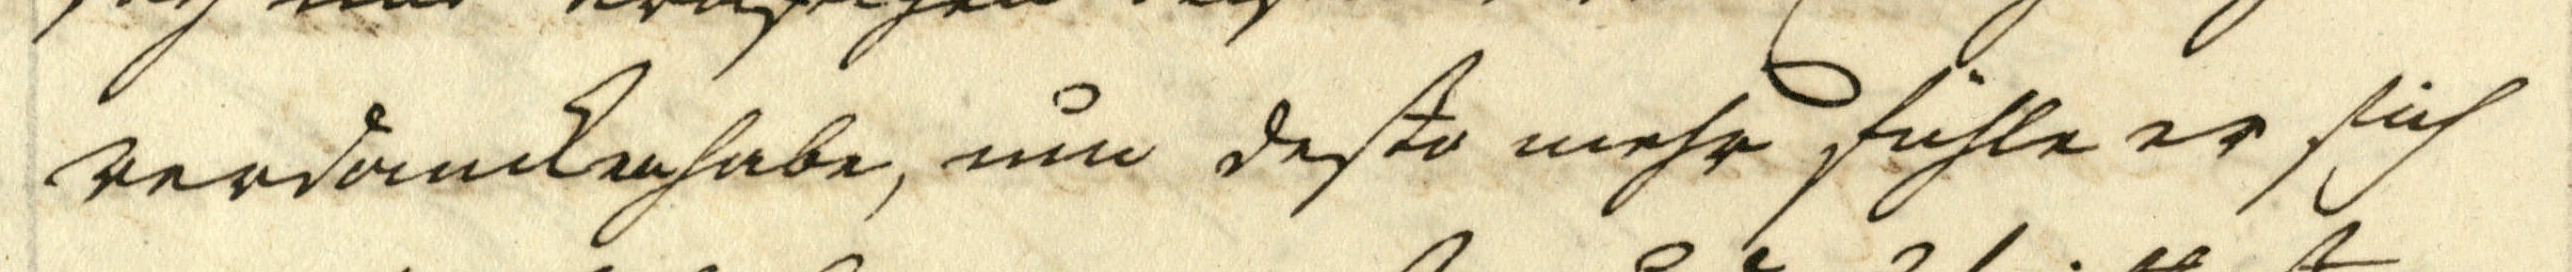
verdanckenhabe, nun desto mehr fühle er sich
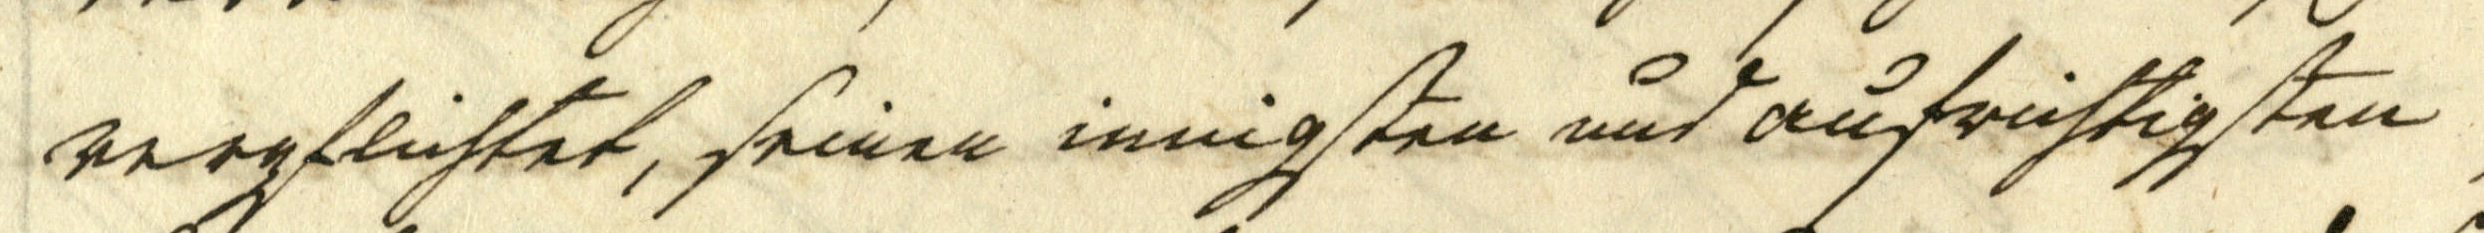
verpflichtet, seinen innigsten und aufrichtigsten
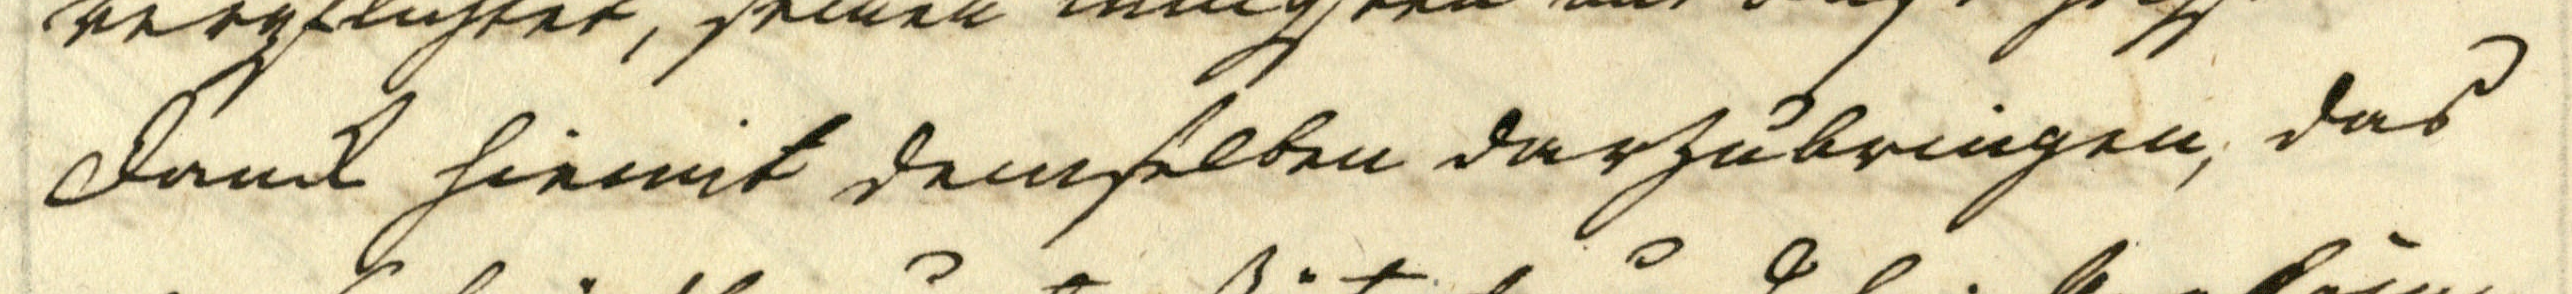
Danck hiemit demselben darzubringen, das
